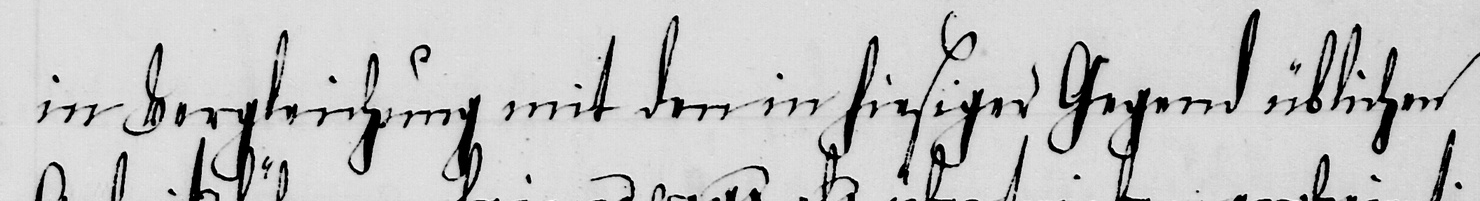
in Vergleichung mit den in hiesiger Gegend üblichen
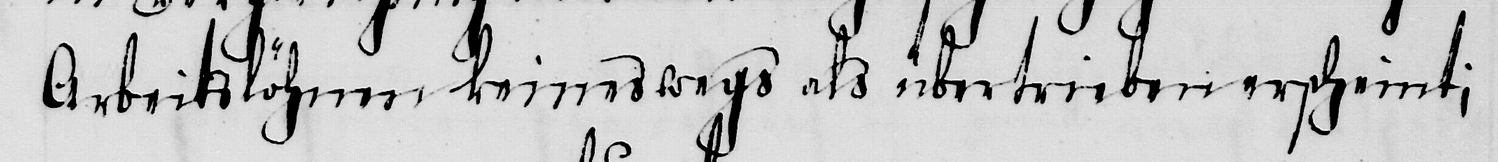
Arbeitslöhnen keineswegs als übertrieben erscheint;
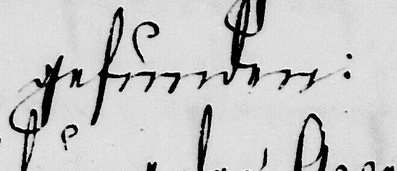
gefunden:
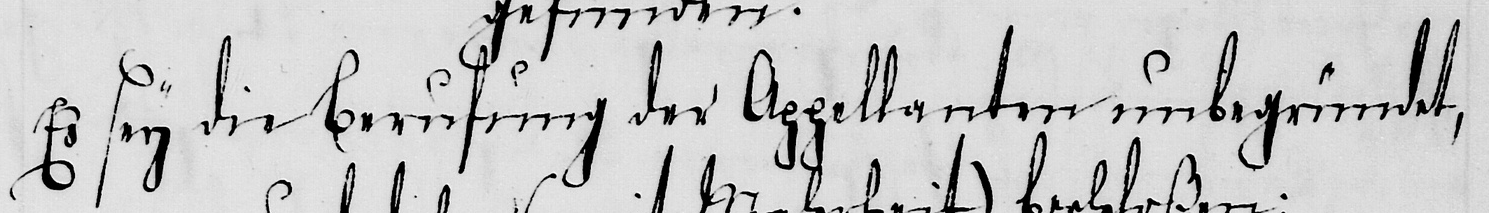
Es sey die Berufung der Appellanten unbegründet,
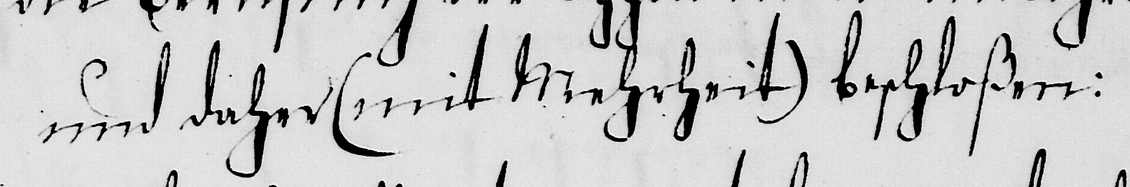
und daher (mit Mehrheit) beschloßen:
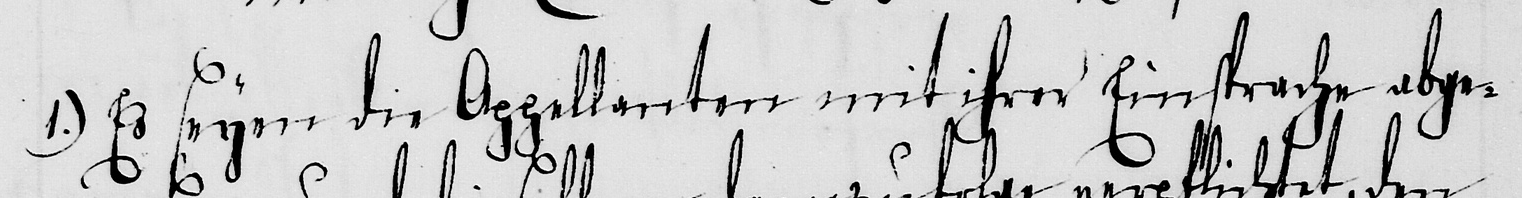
1.) Es seyen die Appellanten mit ihrer Einsprache abge¬
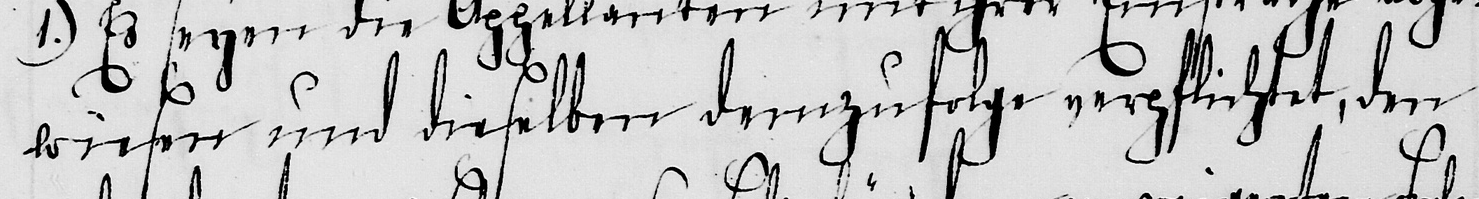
wiesen und dieselben demzufolge verpflichtet, den
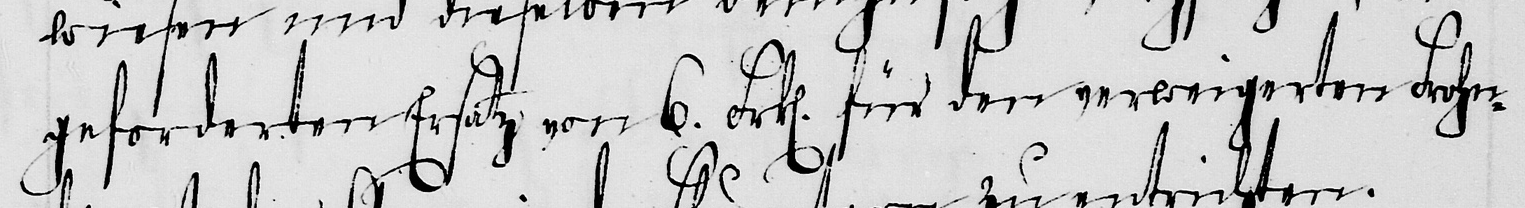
geforderten Ersatz von 6. Frk[en]. für den verweigerten Frohn¬
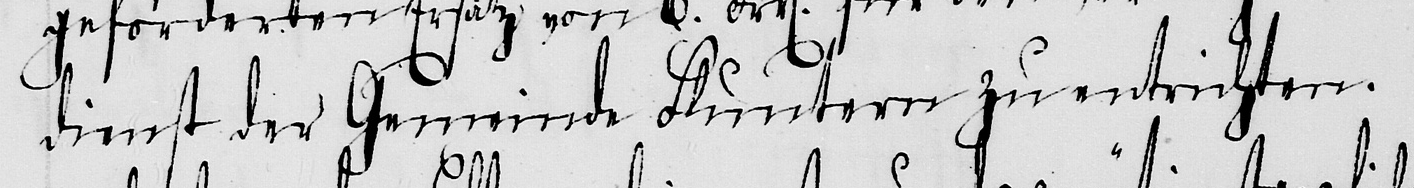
dienst der Gemeinde Fluntern zu entrichten.
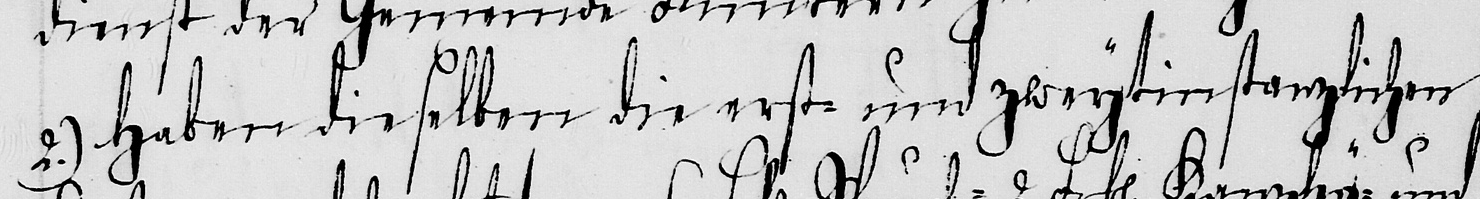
2.) Haben dieselben die erst- und zweytinstanzlichen
